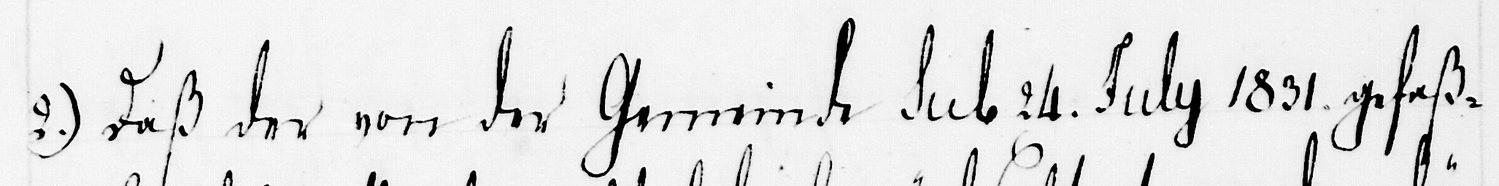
2.) Daß der von der Gemeinde sub 24. July 1831. gefaß¬
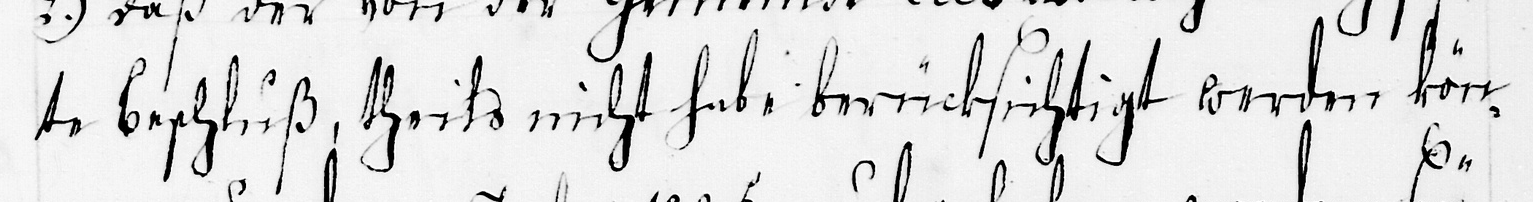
te Beschluß, theils nicht habe berücksichtigt werden kön¬
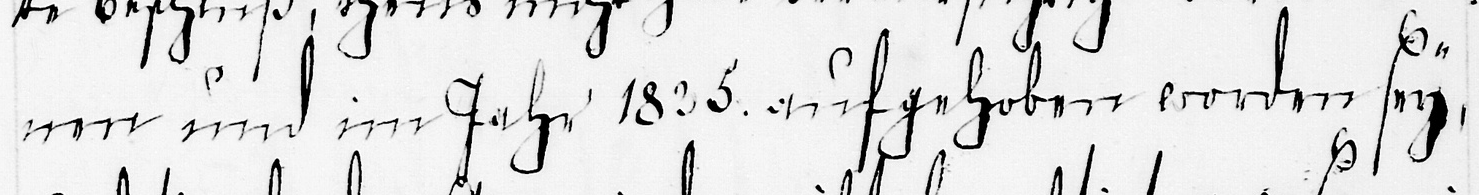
nen und im Jahr 1835. aufgehoben worden sey,
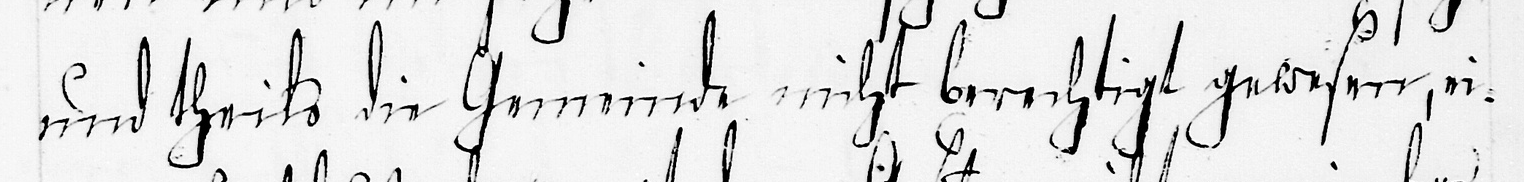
und theils die Gemeinde nicht berechtigt gewesen, ei¬
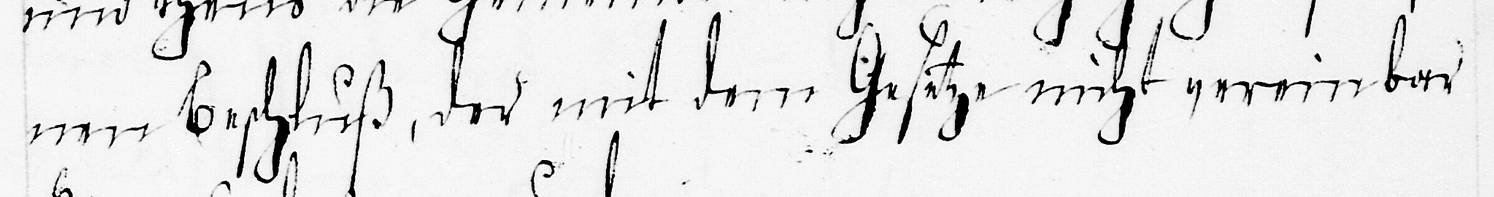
nen Beschluß, der mit dem Gesetze nicht vereinbar
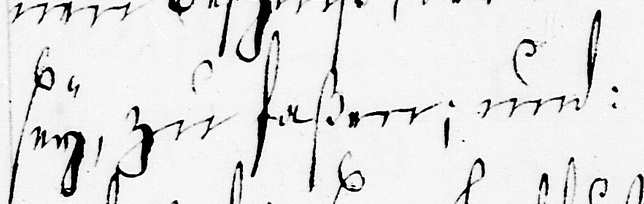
sey, zu faßen; und:
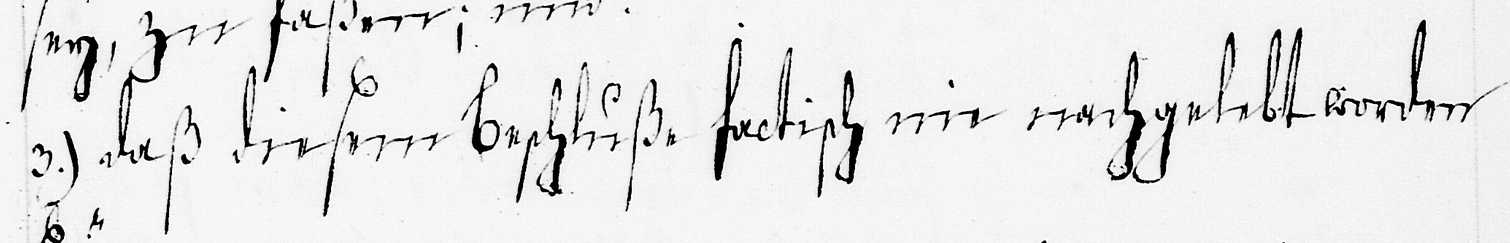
3.) daß diesem Beschluße factisch nie nachgelebt worden
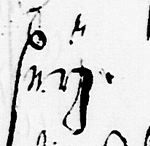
sey.
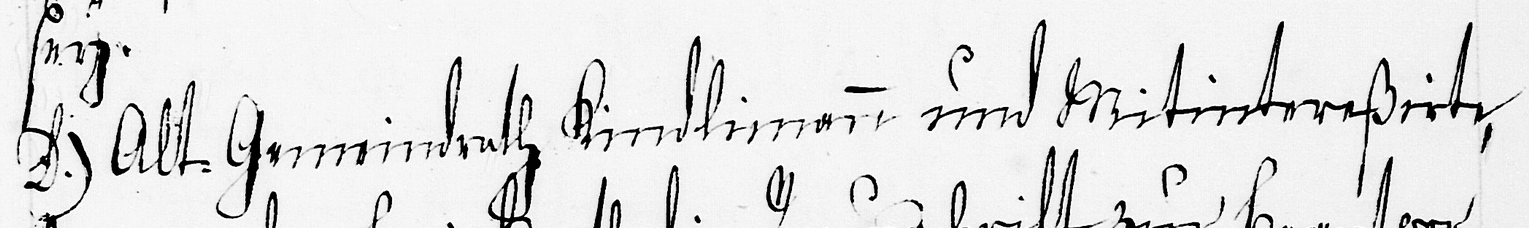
D.) Alt-Gemeindrath Kindlimann und Mitintereßirte,
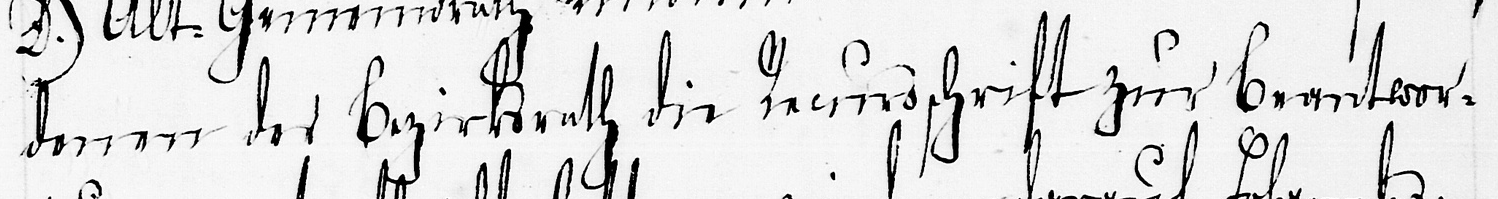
denen der Bezirksrath die Recursschrift zur Beantwor¬
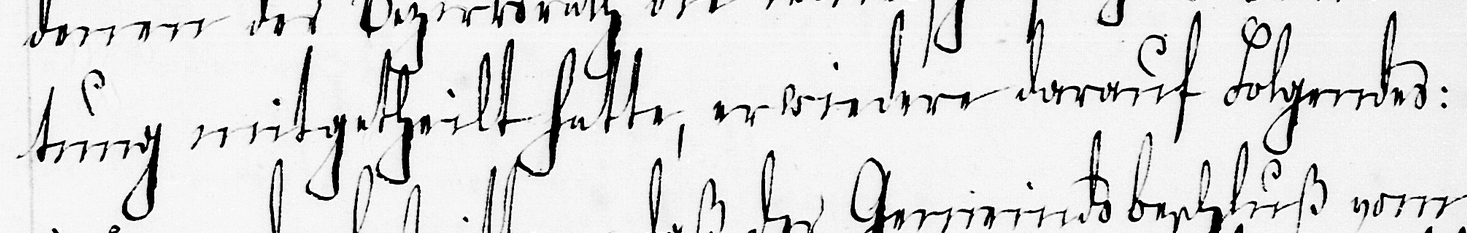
tung mitgetheilt hatte, erwiedere darauf Folgendes:
